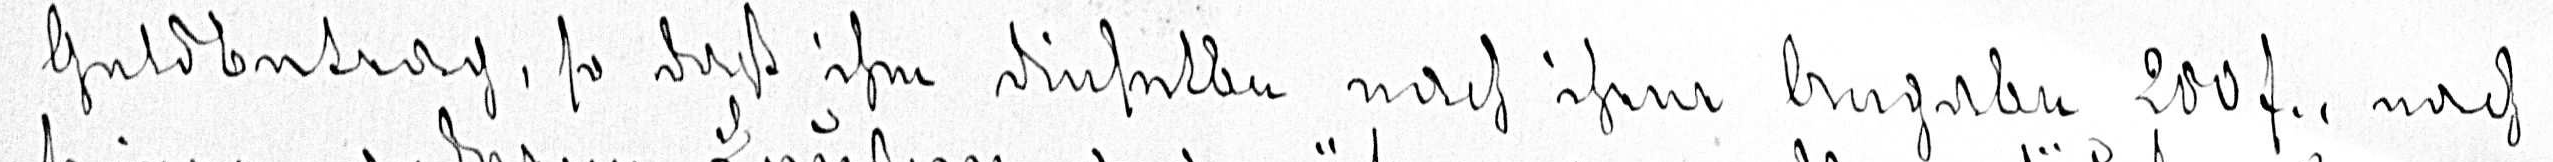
Geldbetrag, so daß ihm dieselbe nach ihrer Angabe 200f, nach
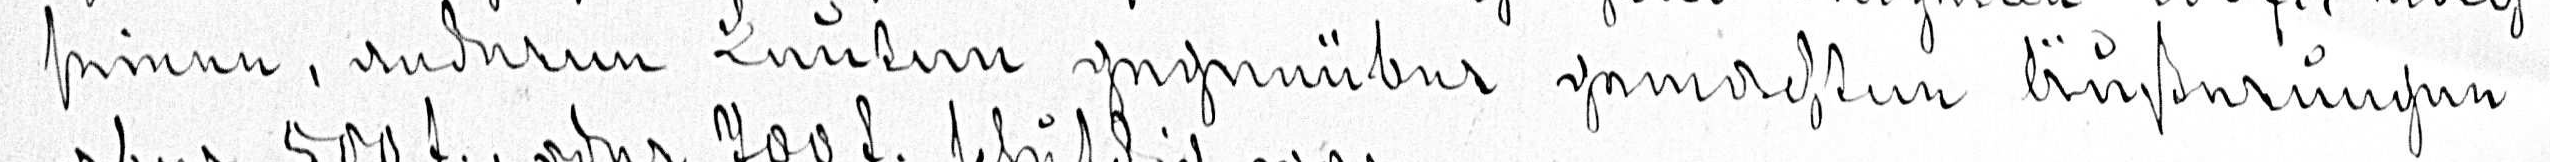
seinen, anderen Leuten gegenüber gemachten Äußerungen
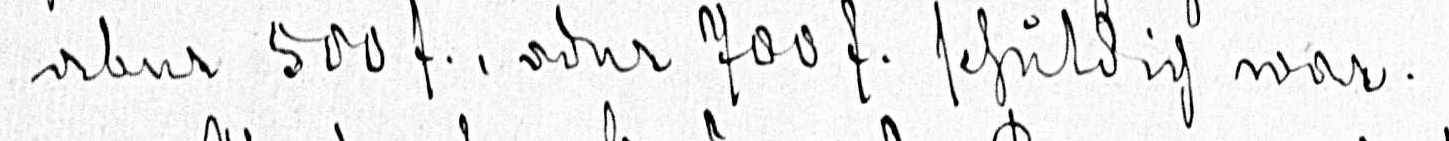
aber 500f oder 700f schuldig war.
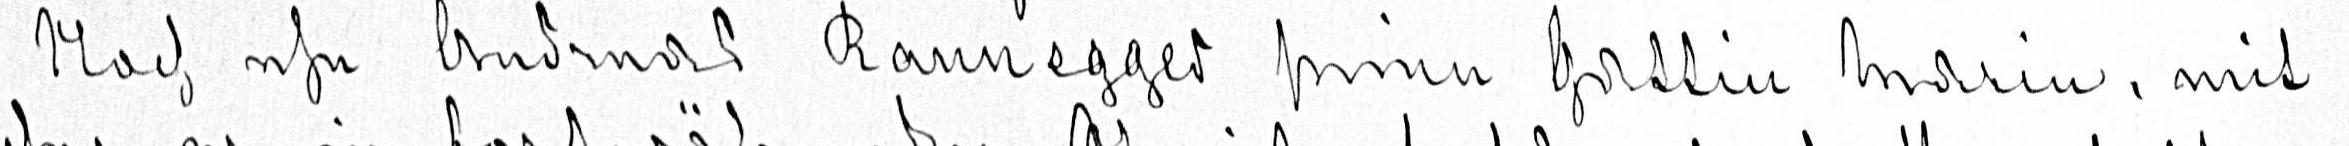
Noch ehe Andreas Raunegger seine Gattin Marie, mit
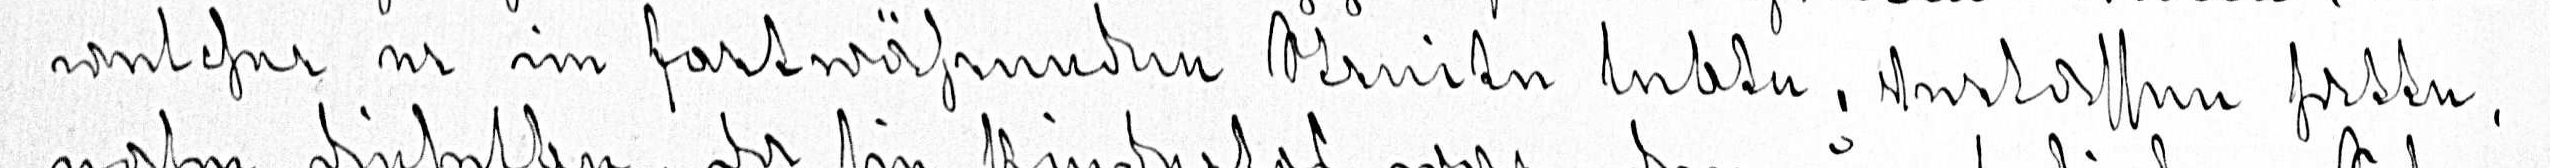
welcher er im fortwährenden Streite lebte, verlassen hatte,
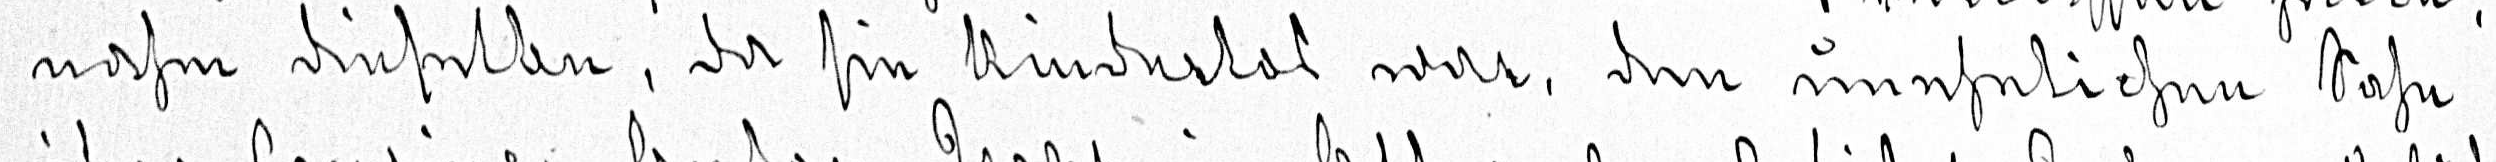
nahm dieselbe, da sie kinderlos war, den unehelichen Sohn
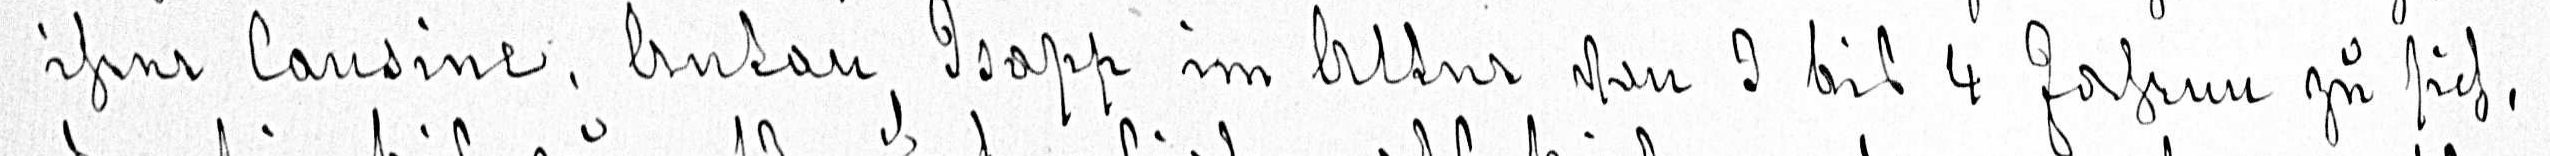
ihrer Cousine, Anton Isopp im Alter von 3 bis 4 Jahren zu sich,
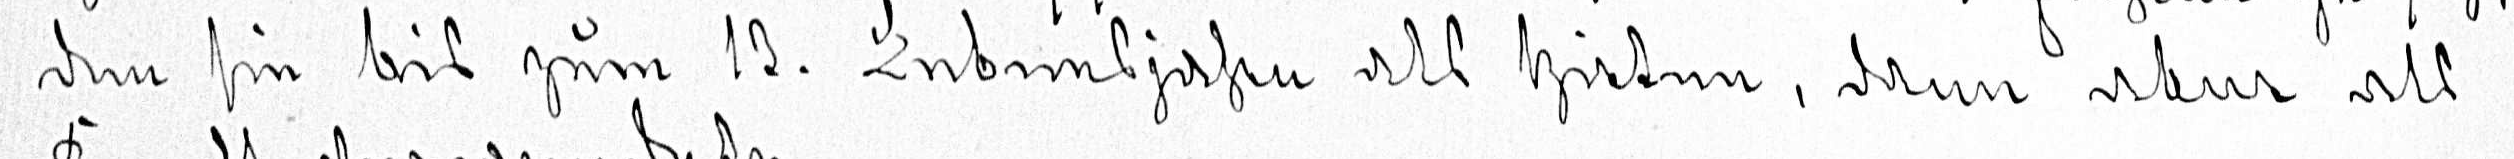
den sie bis zum 13. Lebensjahre als Hirten, dann aber als
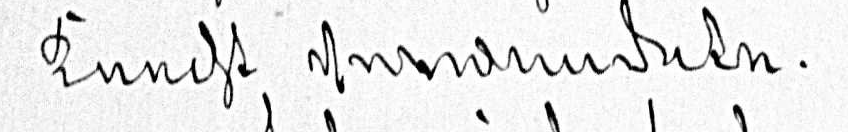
Knecht verwendete.
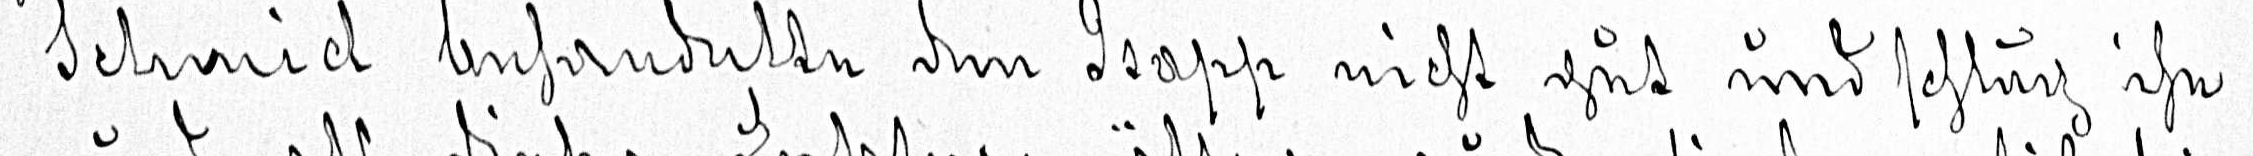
Schmid behandlete den Isopp nicht gut und schlug ihn
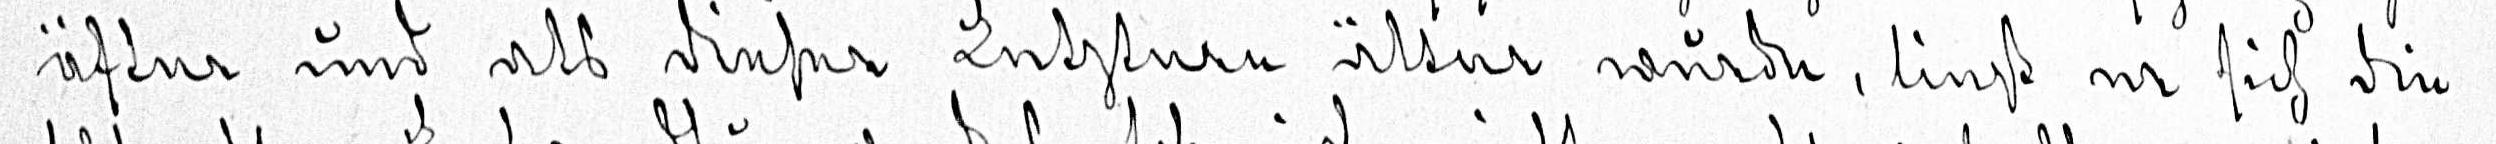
öfter und als dieser Letztere älter wurde, ließ er sich die
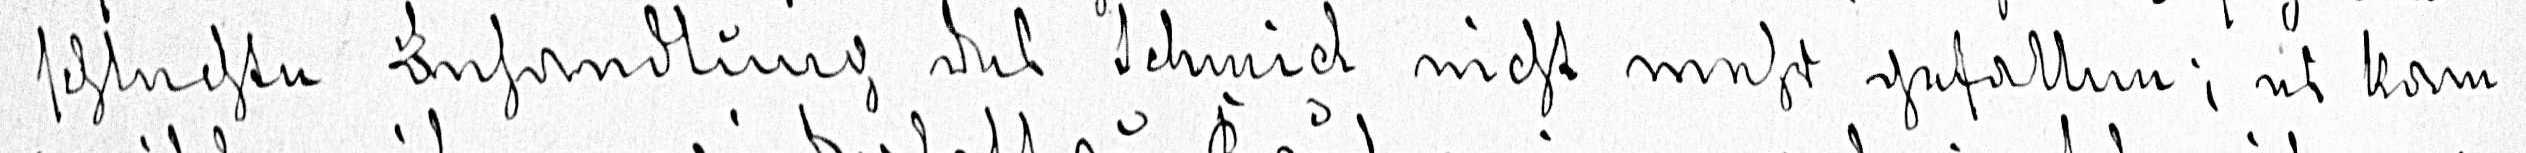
schlechte Behandlung des Schmid nicht mehr gefallen; es kam
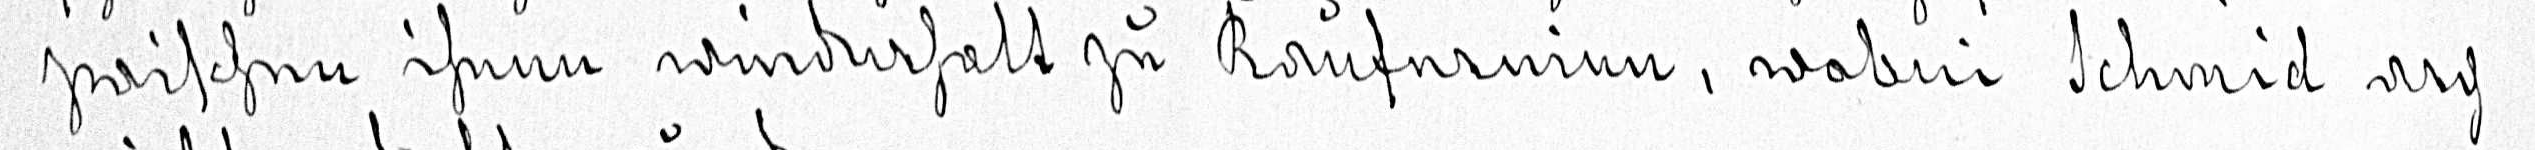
zwischen ihnen wiederholt zu Raufereien, wobei Schmid arg
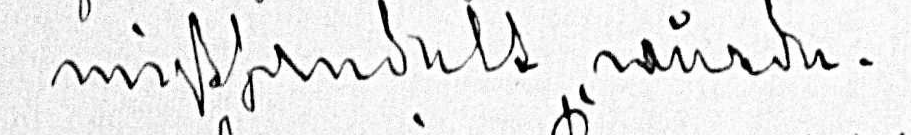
mißhandelt wurde.
